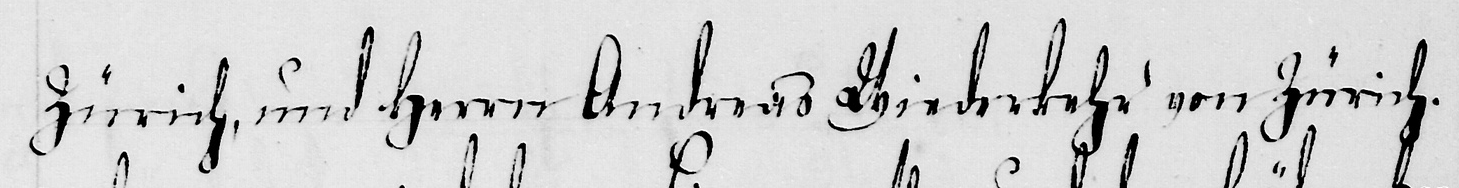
Zürich, und Herrn Andreas Wiederkehr von Zürich.
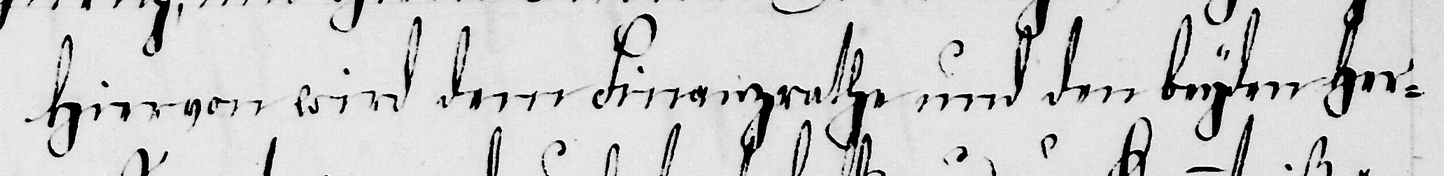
Hiervon wird dem Finanzrathe und den beyden Her¬
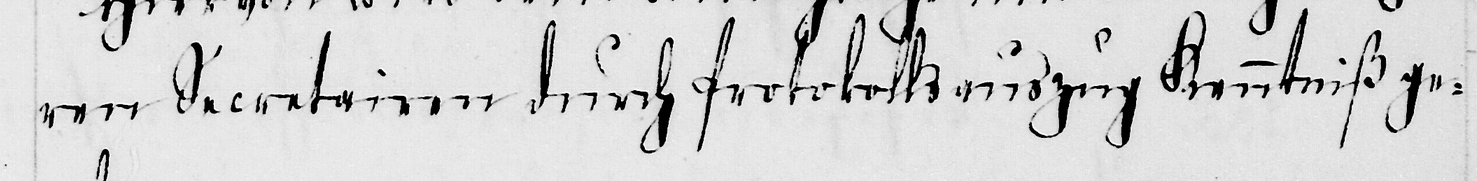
ren Secretairen durch Protokollsauszug Kenntniß ge¬
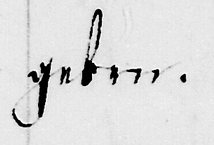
geben.
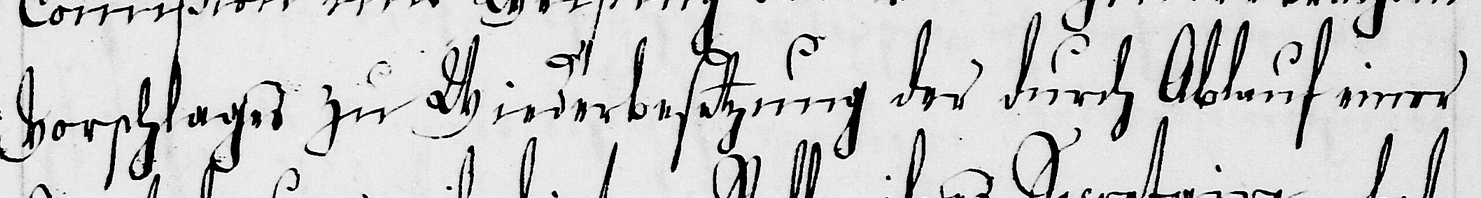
Vorschlages zu Wiederbesetzung der durch Ablauf einer
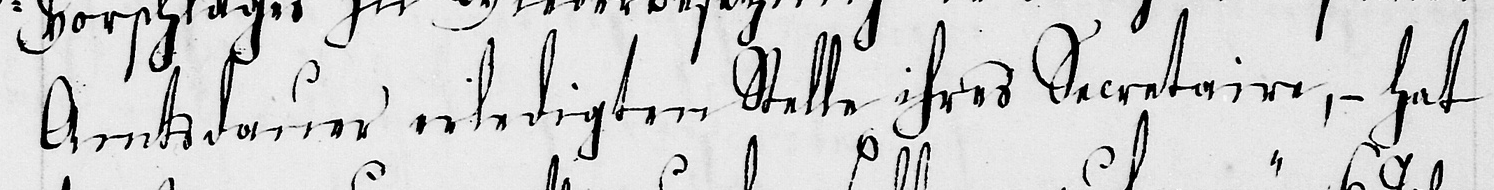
Amtsdauer erledigten Stelle ihres Secretaire, – hat
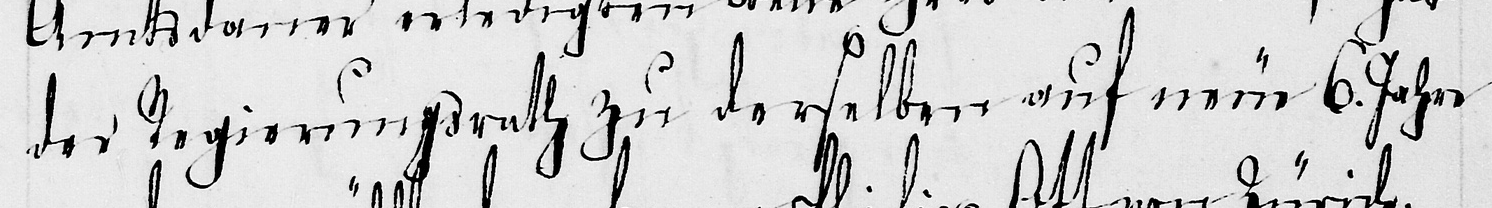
der Regierungsrath zu derselben auf neue 6. Jahre
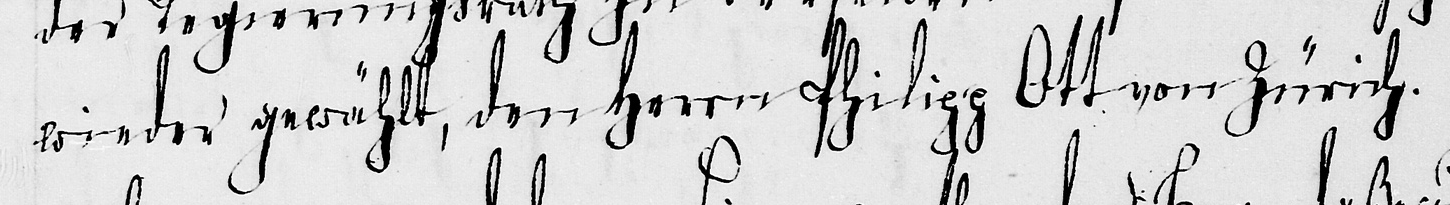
wieder gewählt, den Herrn Philipp Ott von Zürich.
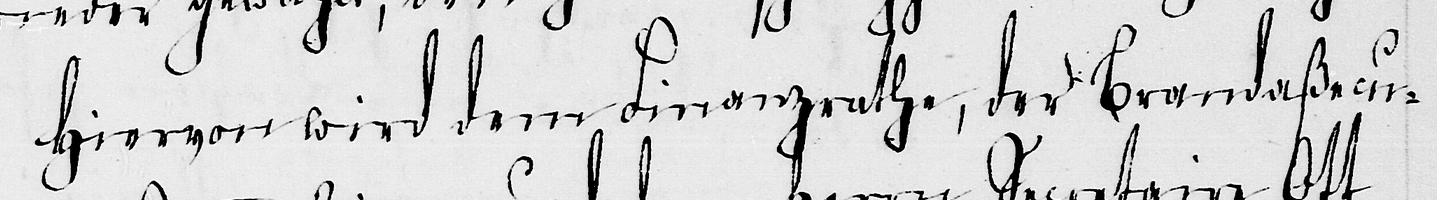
Hiervon wird dem Finanzrathe, der Brandaßecu¬
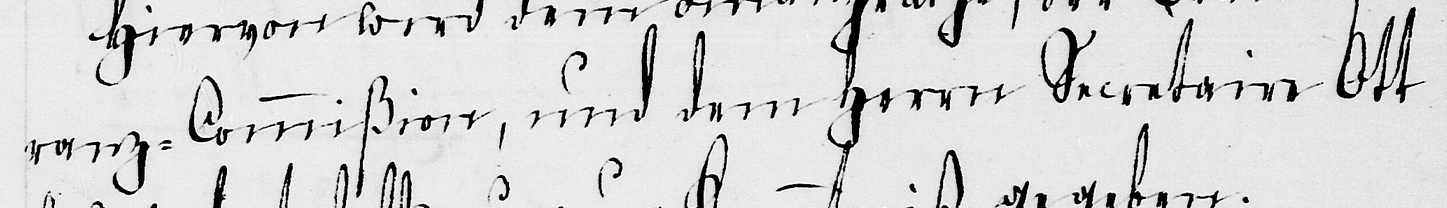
ranz-Commißion, und dem Herrn Secretaire Ott
